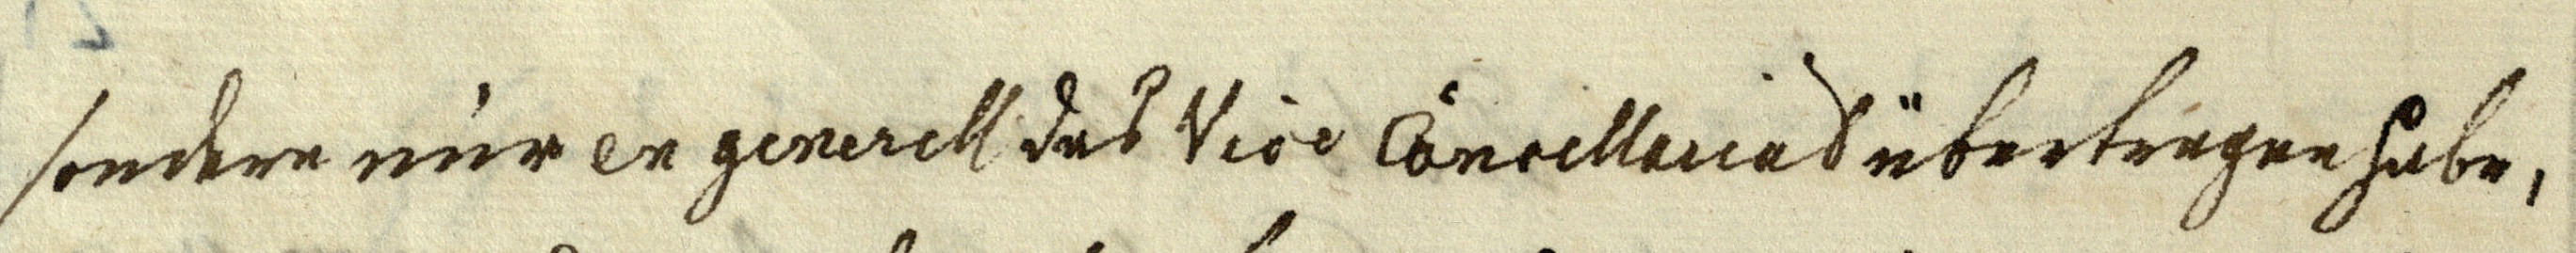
sondern nur ex generell das Vice Cancellariat übertragen habe,
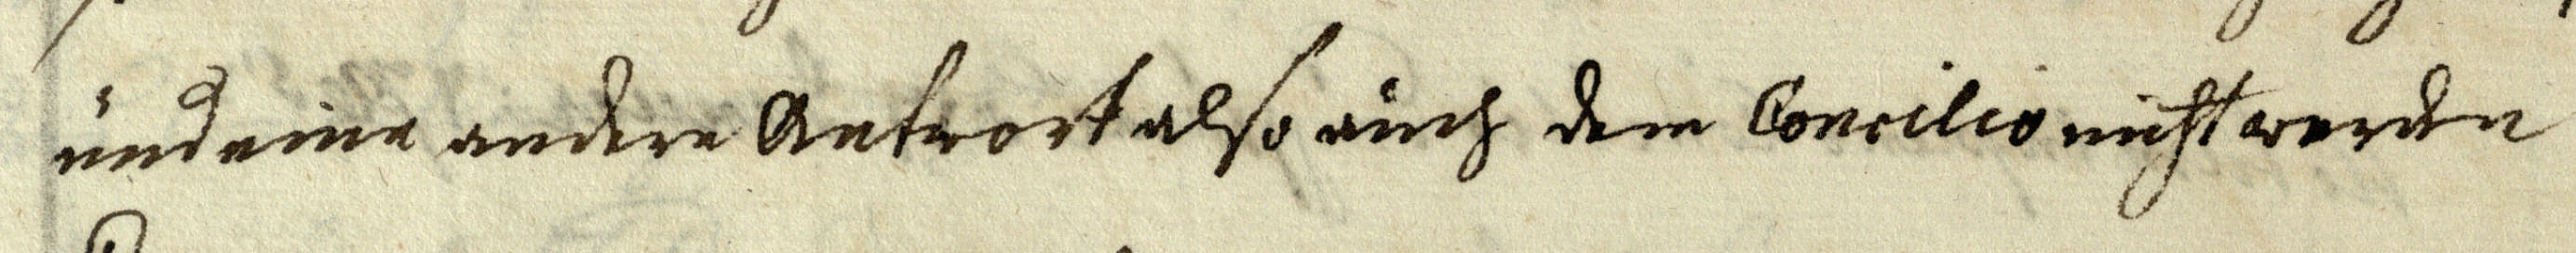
und eine andere Antwort also auch dem Concilio nicht werden
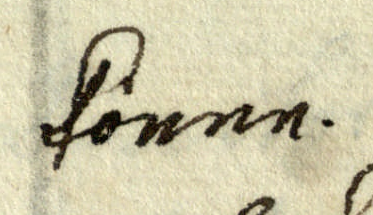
könne.
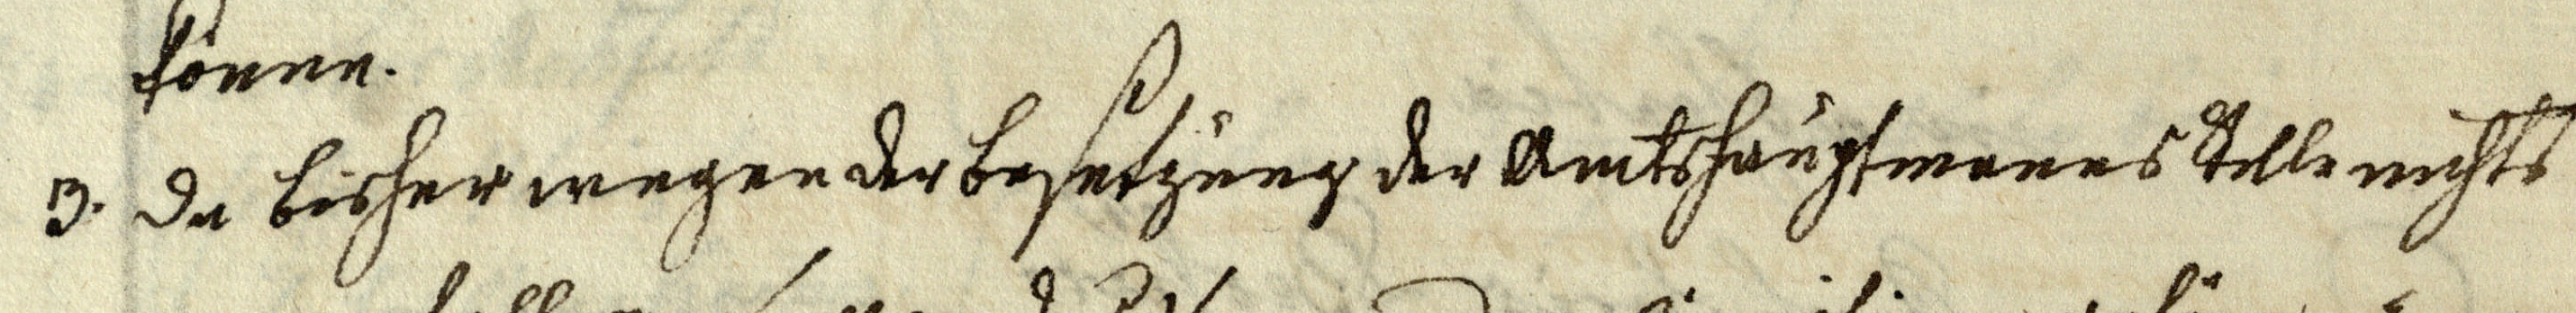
3 Da bisher wegen der Besetzung der Amtshauptmanns Stelle nichts
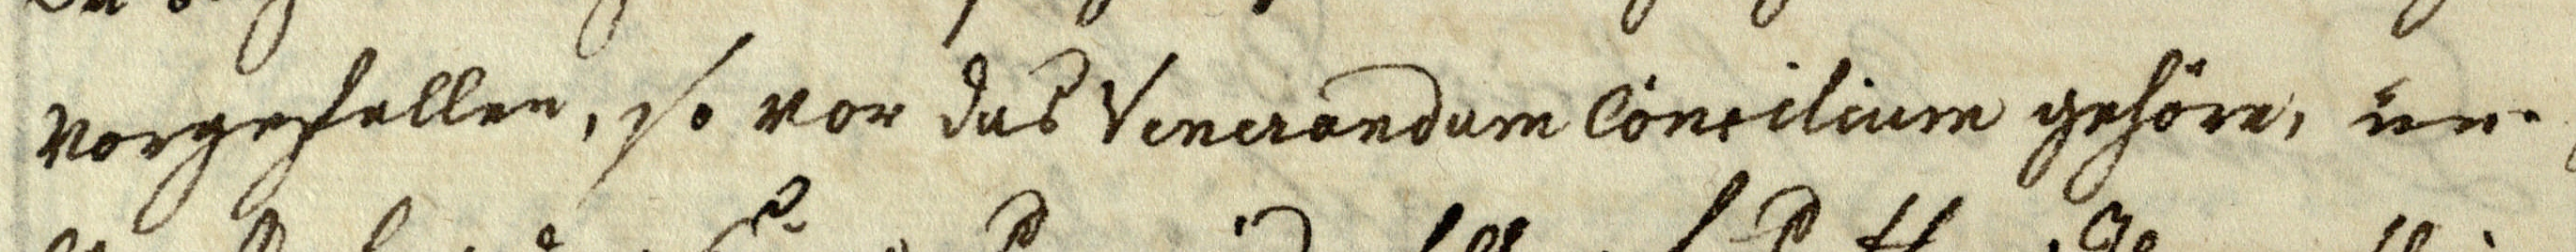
vorgefallen, so vor das Venerandum Concilium gehöre, un¬
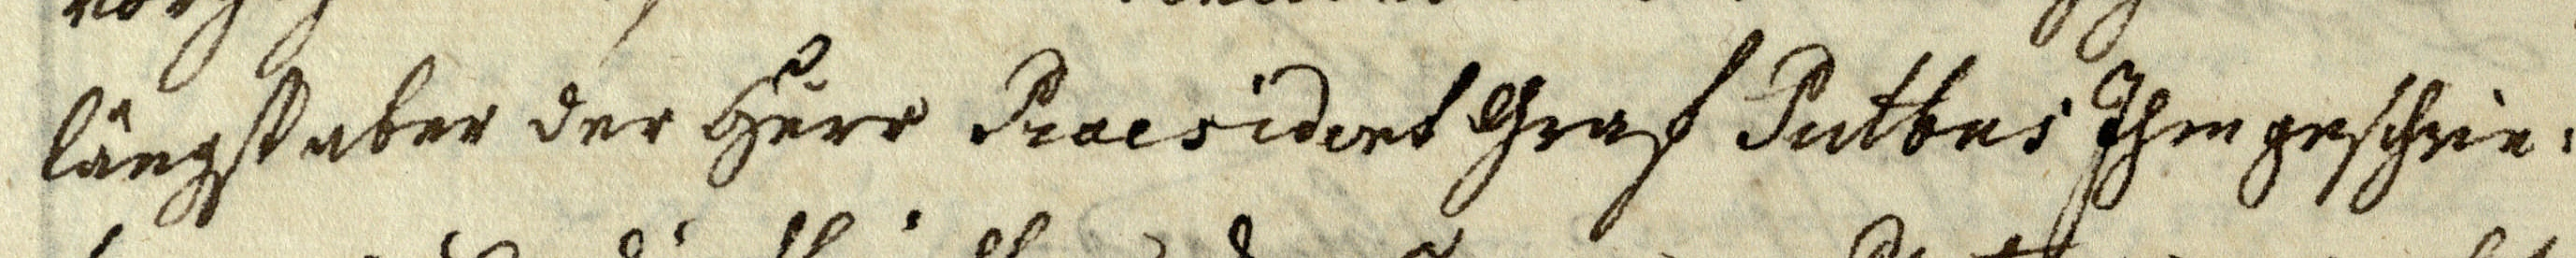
längst aber der Herr Praesident Graf Putbus Ihm geschrie¬
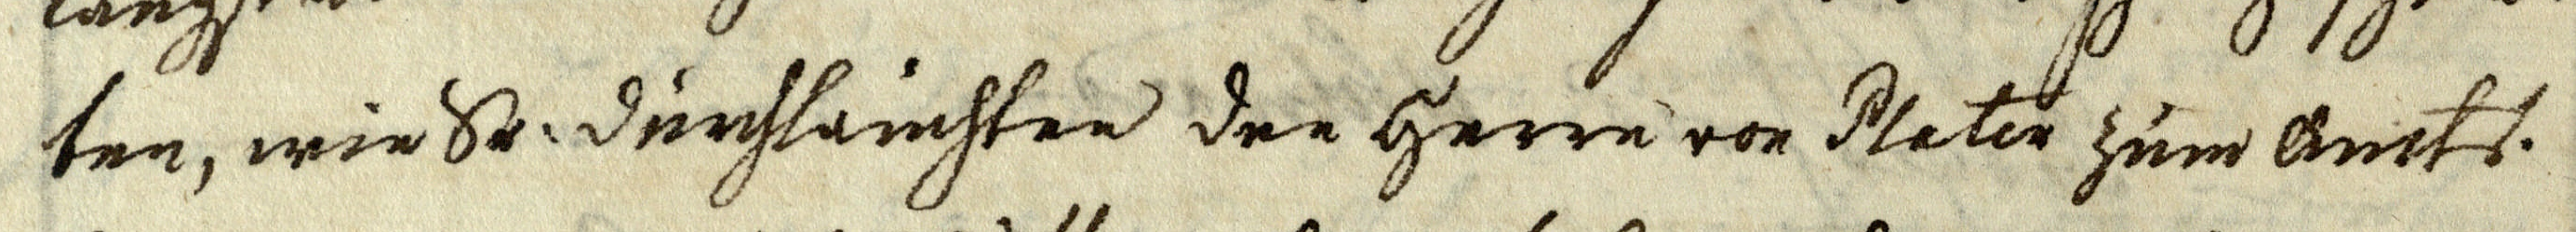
ben, wie Sr Durchlauchten den Herrn von Platen zum Amts¬
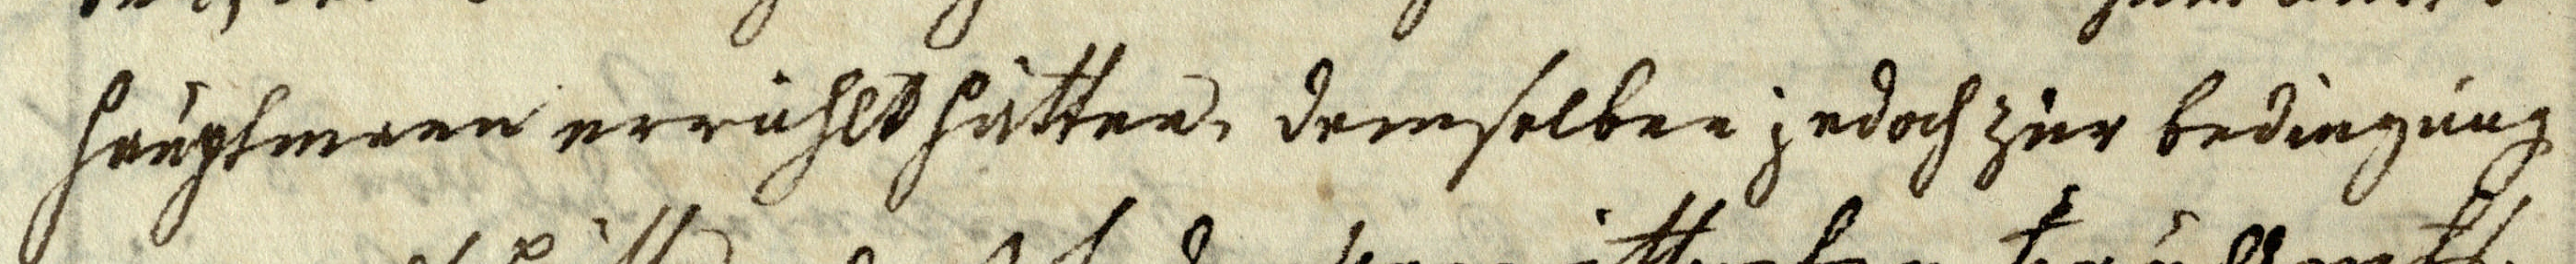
hauptmann erwählt hätten, demselben jedoch zur Bedingung
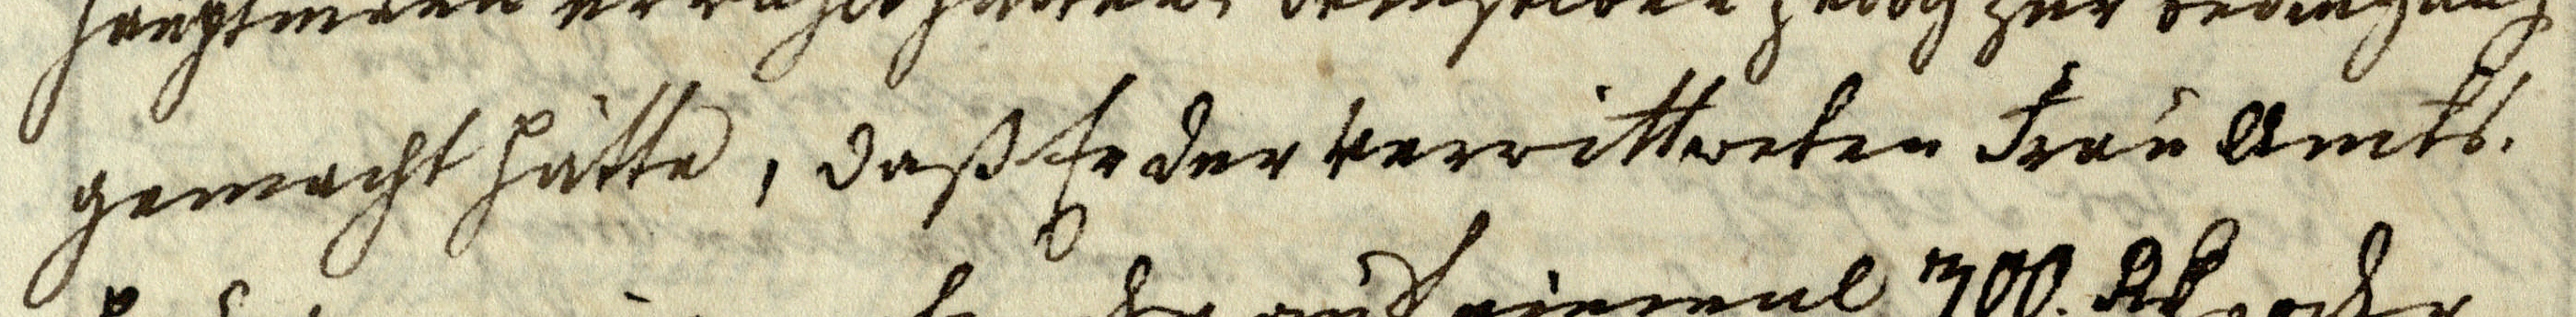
gemacht hätte, daß Er der verwittweten Frau Amts¬
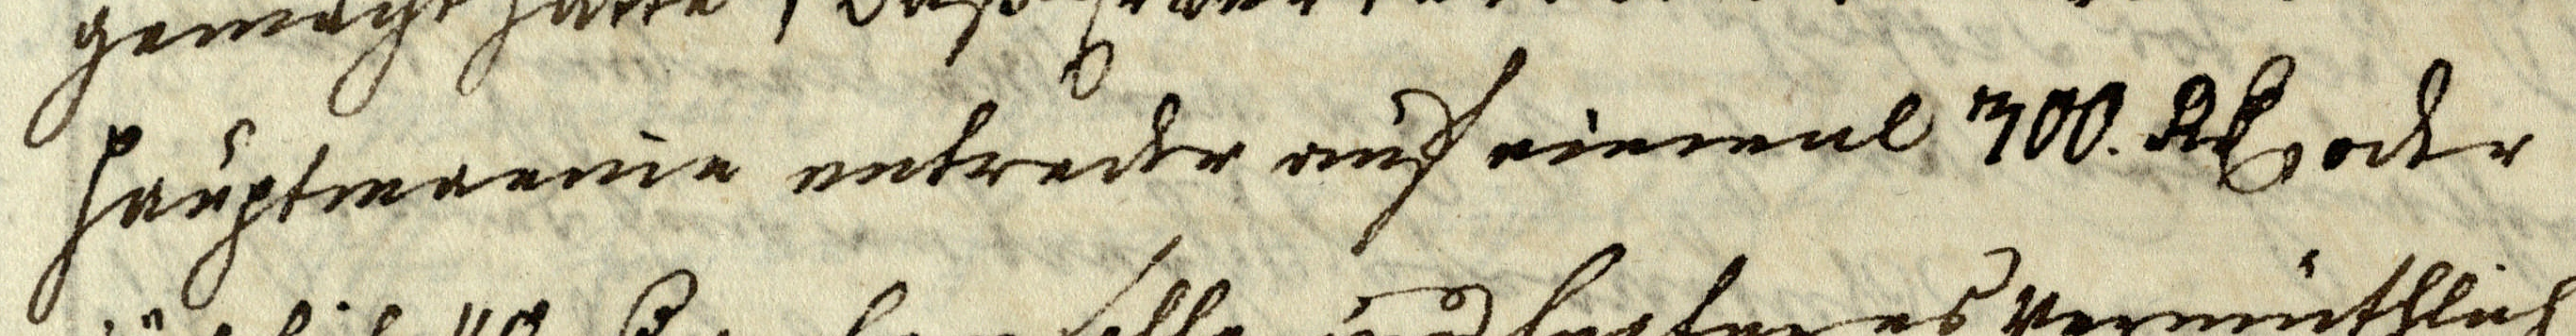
Hauptmaenin entweder auf einmahl 300 Rl. oder
